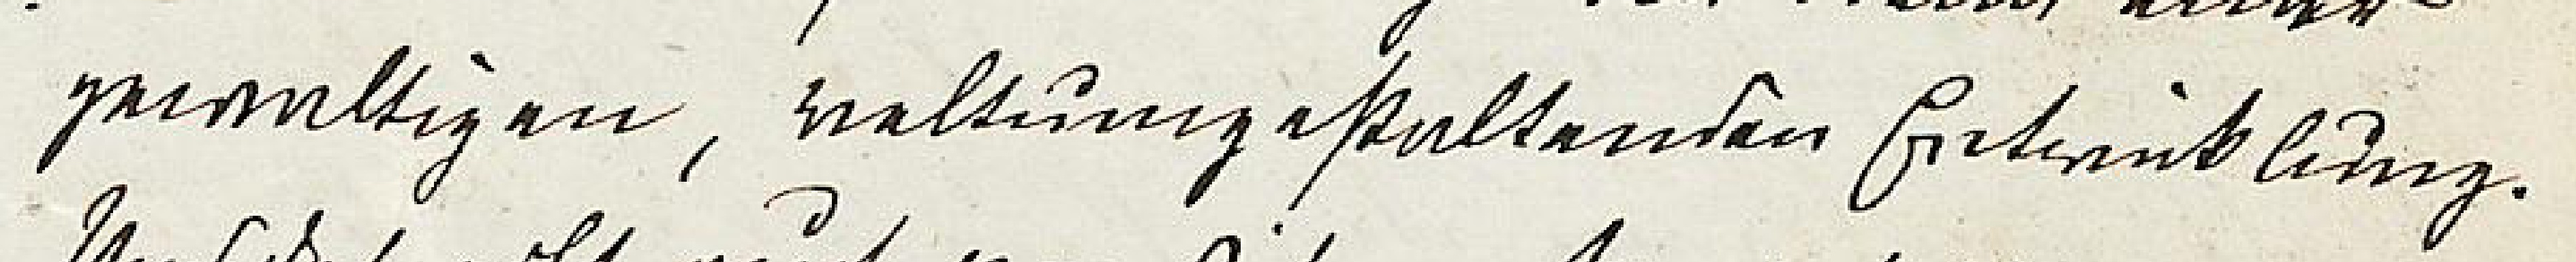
gewaltigen, weltumgestaltenden Entwicklung.
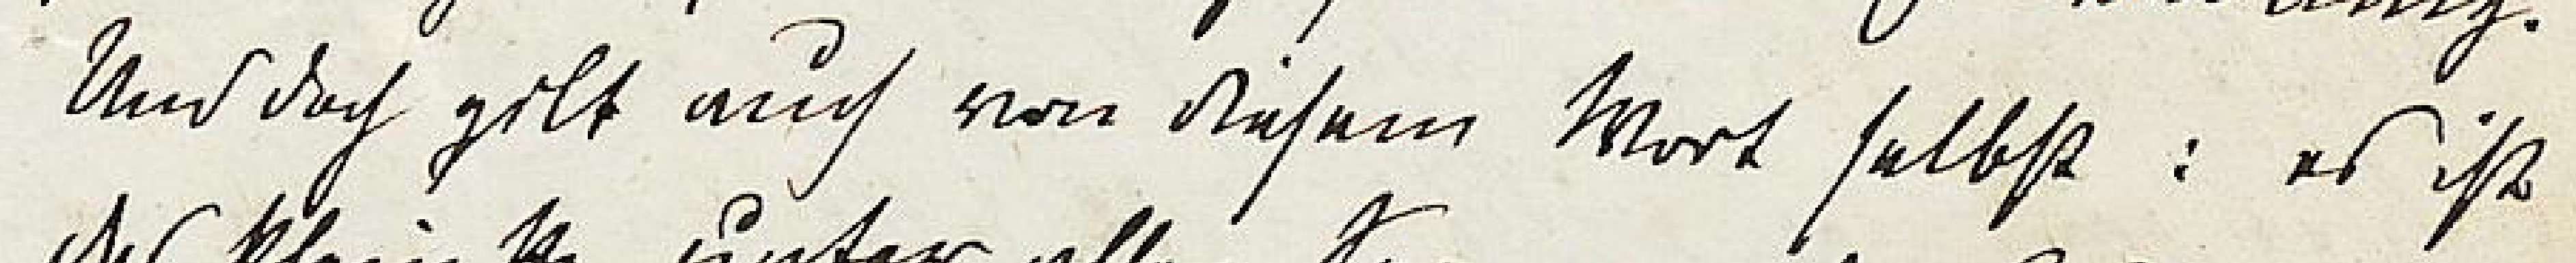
Und doch gilt auch von diesem Wort selbst: es ist
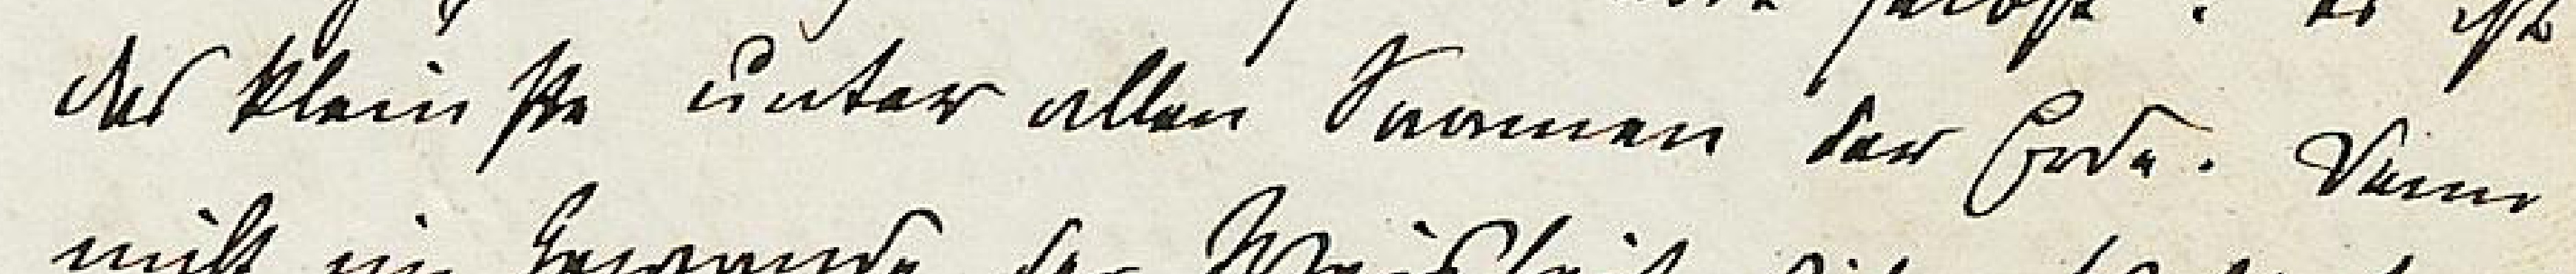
das kleinste unter allen Samen der Erde. Denn
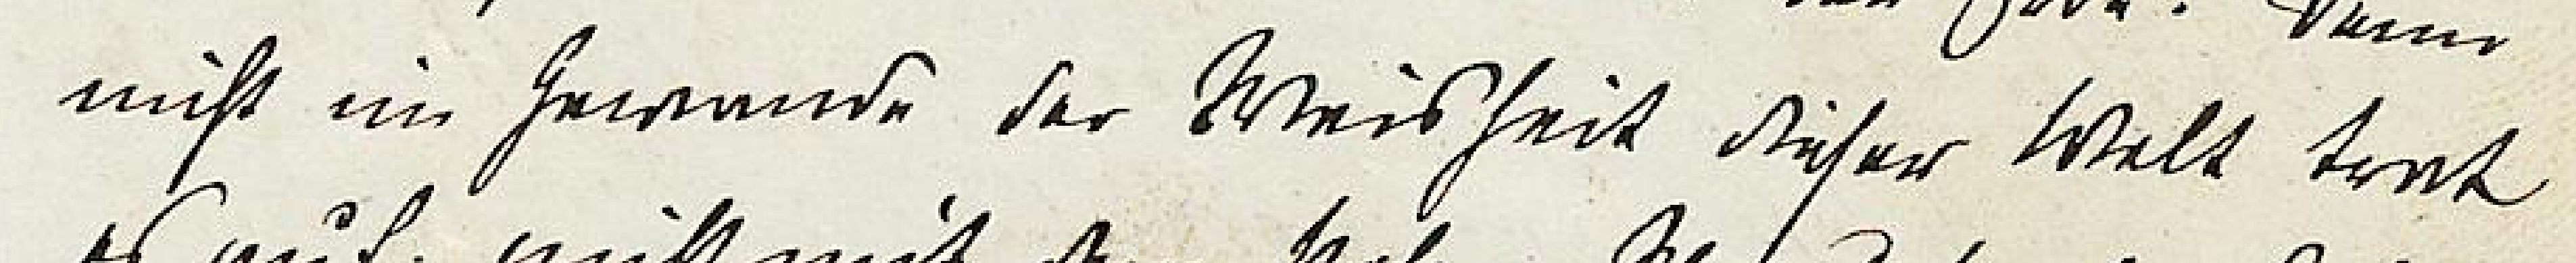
nicht im Gewande der Weisheit dieser Welt trat
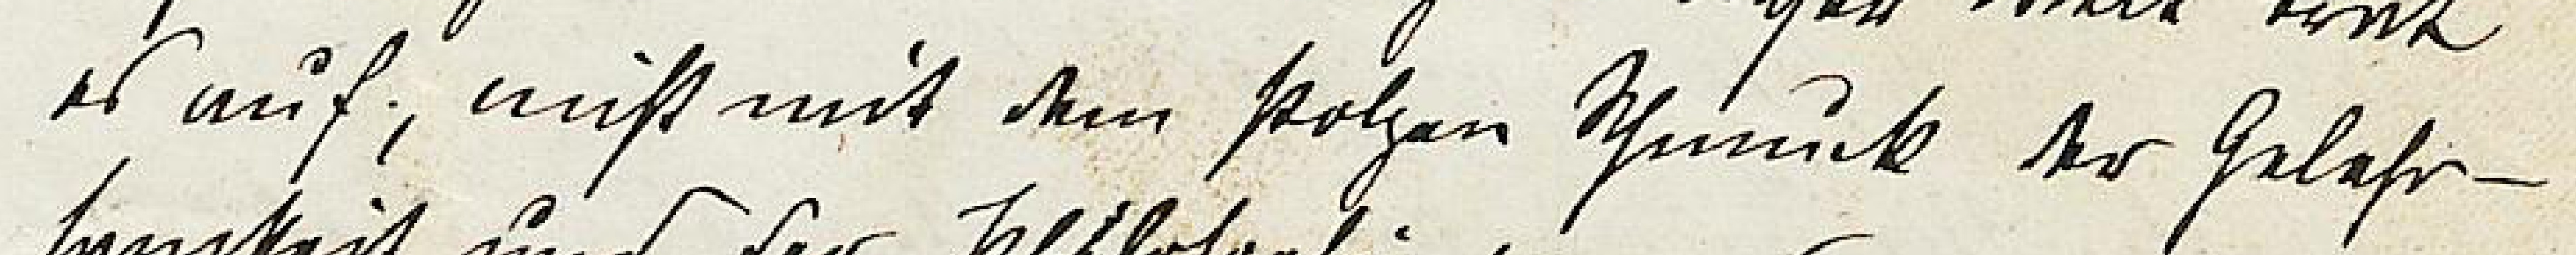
es auf, nicht mit dem stolzen Schmuck der Gelehr¬
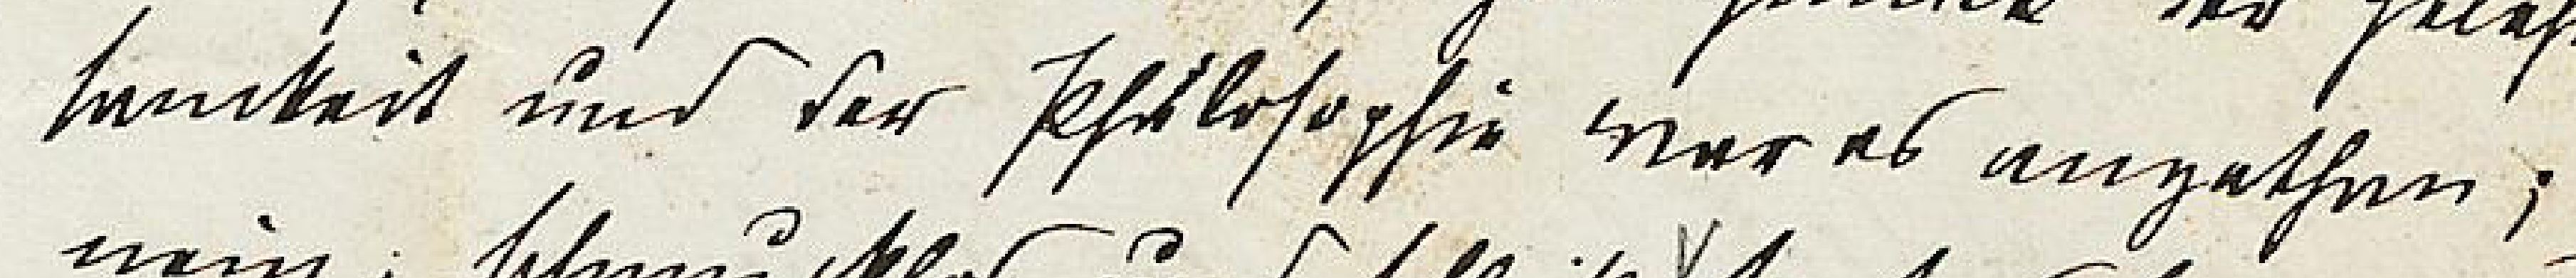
samkeit und der Philosophie war es angethan;
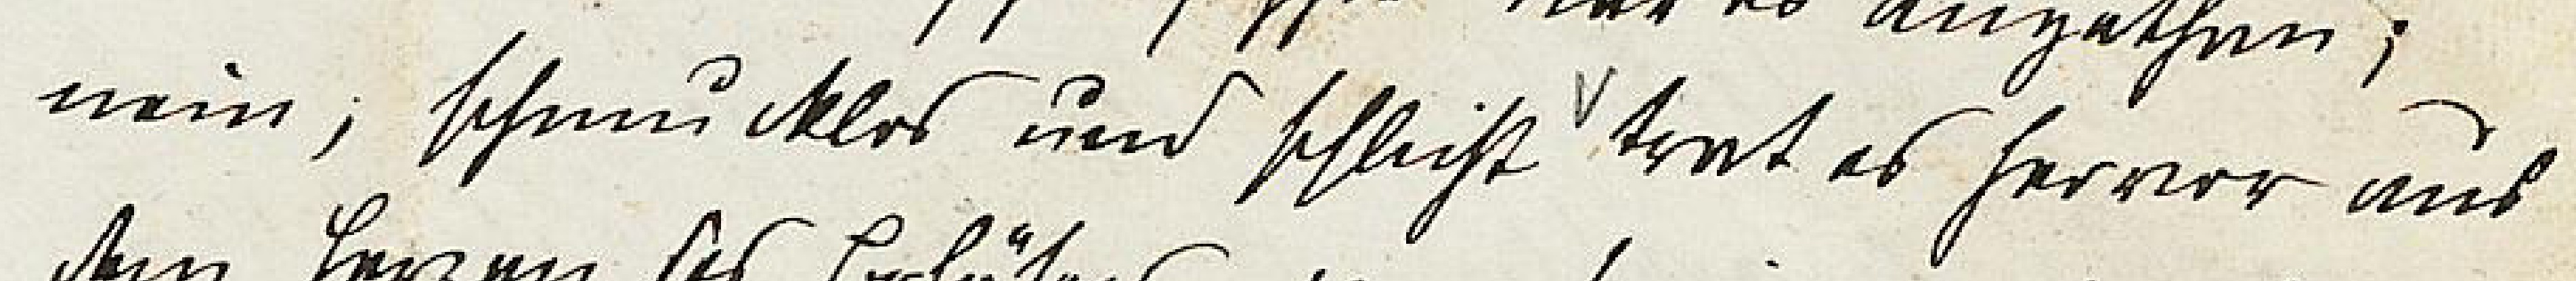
nein; schmucklos und schlicht V trat es ferner aus
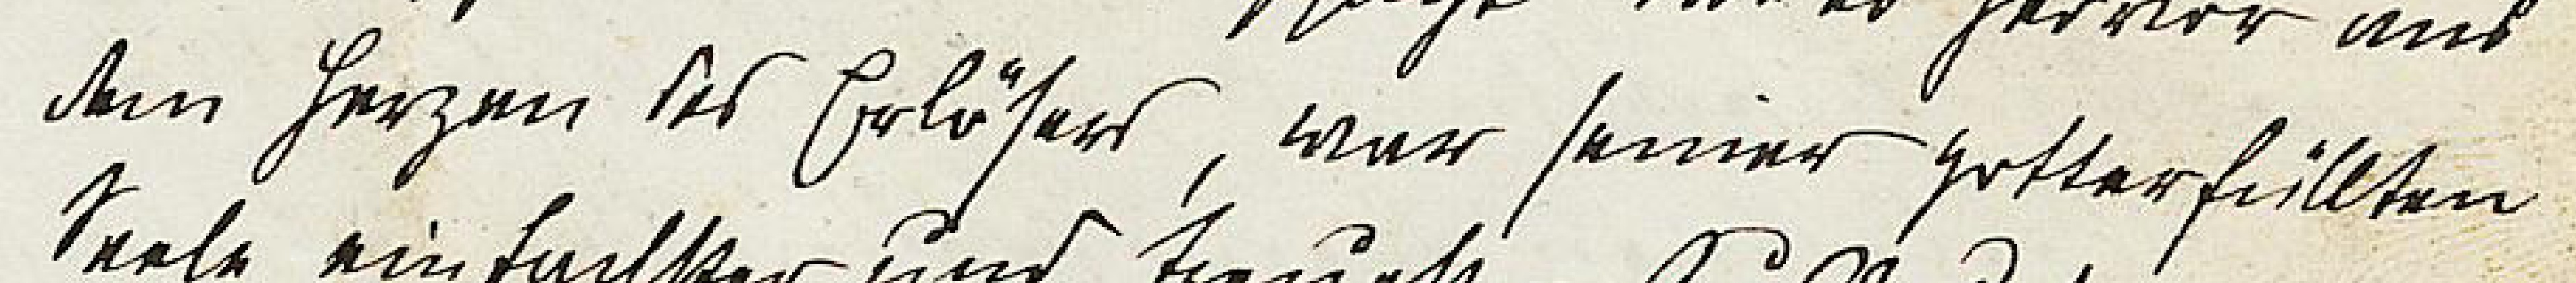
dem Herzen des Erlösers, war seiner gotterfüllten
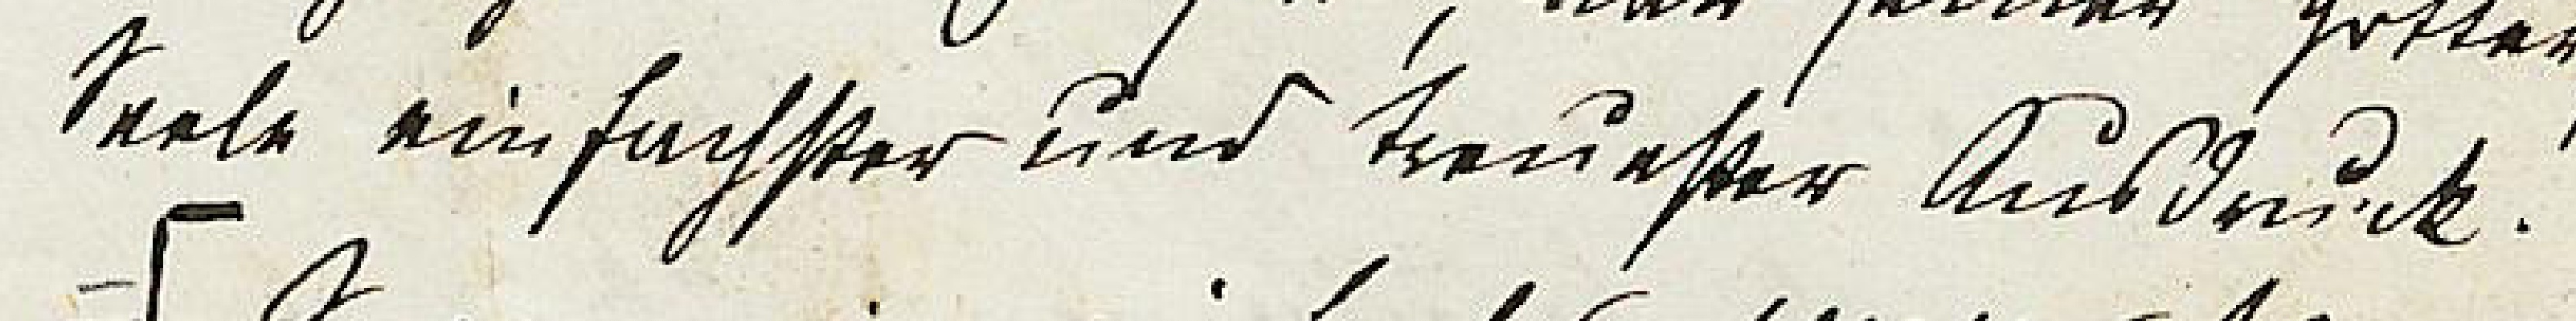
Selle einfachster und treuester Ausdruck.
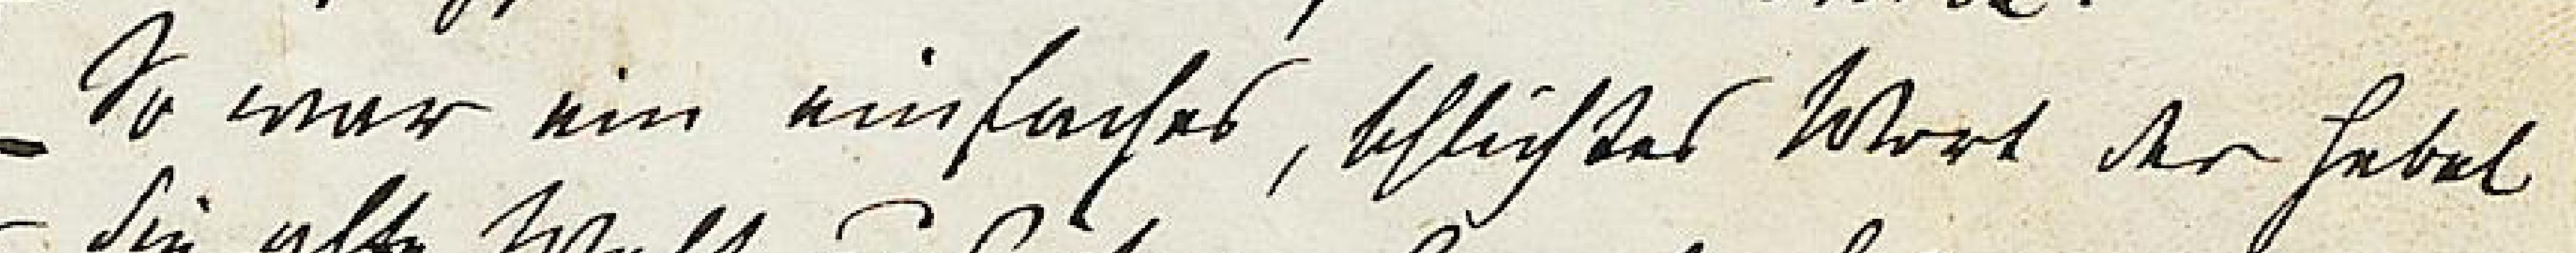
So war ein einfachse, schlichtes Wort der Hebel
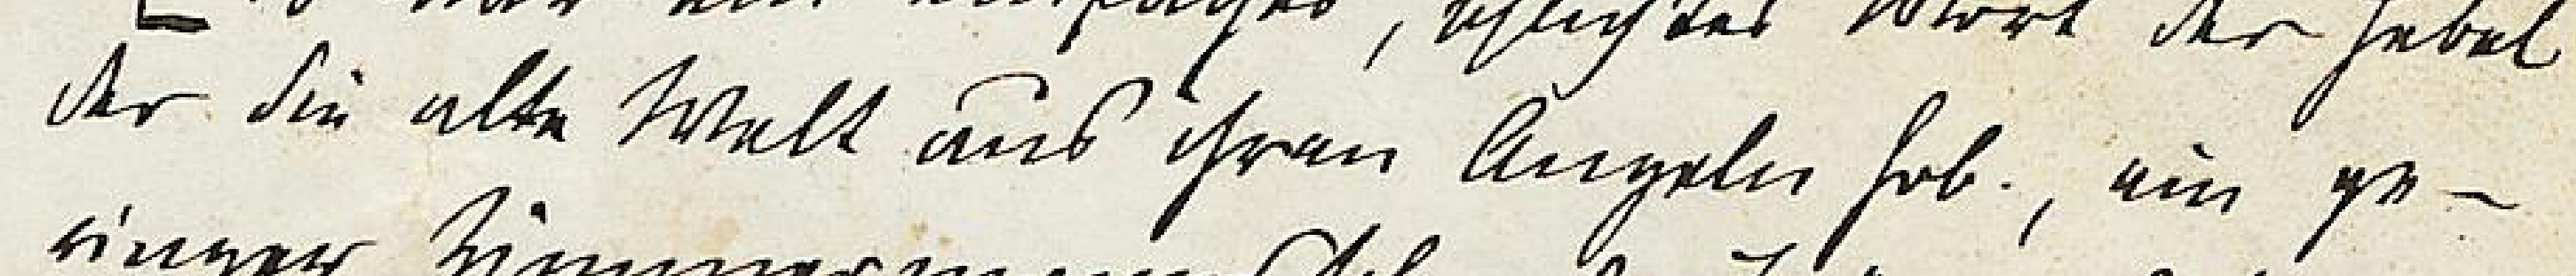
der die alte Welt aus ihren Angeln hob, ein ge¬
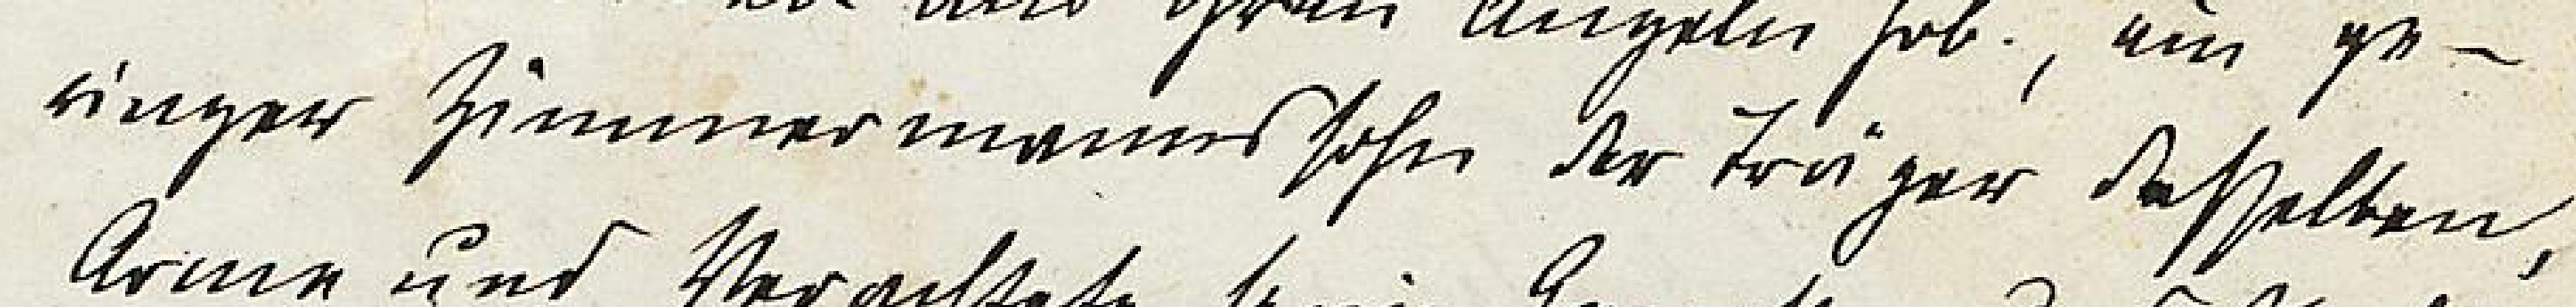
ringer Zimmermannssohn der Träger desselben,
